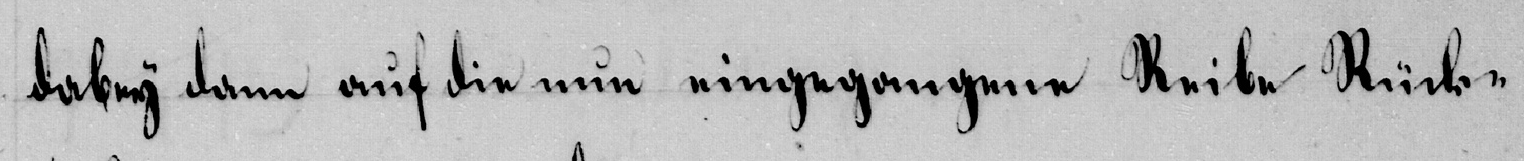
dabey dann auf die nun eingegangene Reibe Rück¬
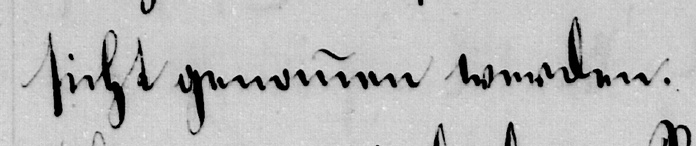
sicht genommen werden.
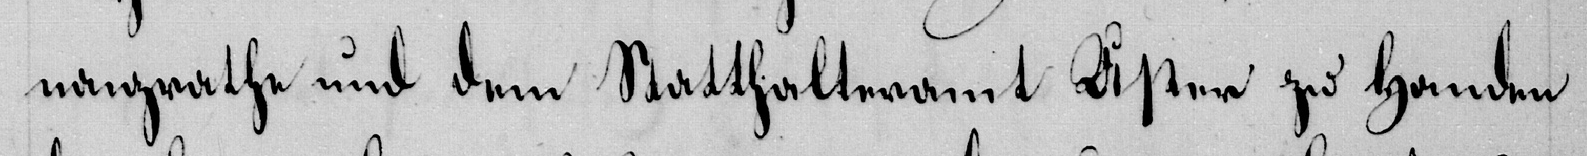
nanzrathe und dem Statthalteramt Uster zu Handen
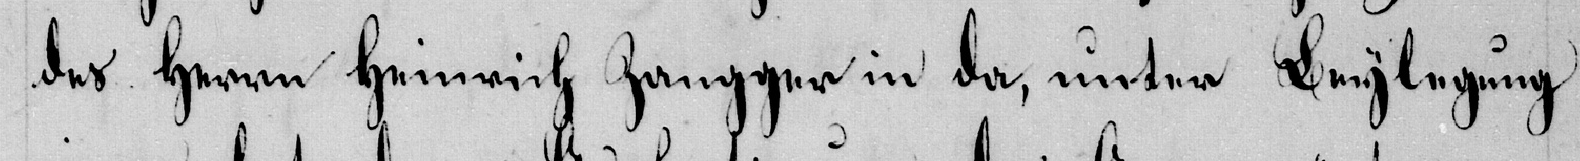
des Herrn Heinrich Zangger in da, unter Beylegung
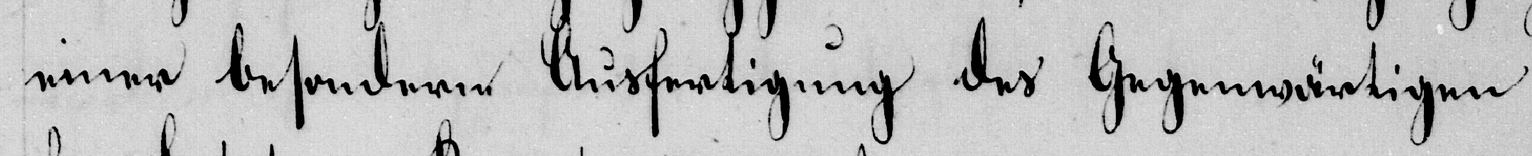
einer besondern Ausfertigung des Gegenwärtigen
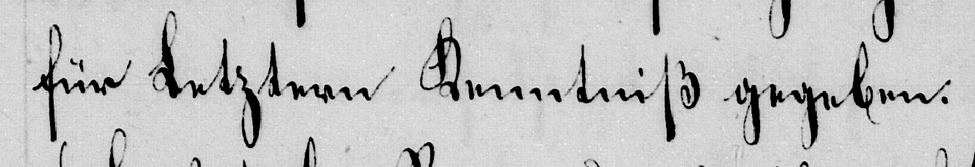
für Letztern Kenntniß gegeben.
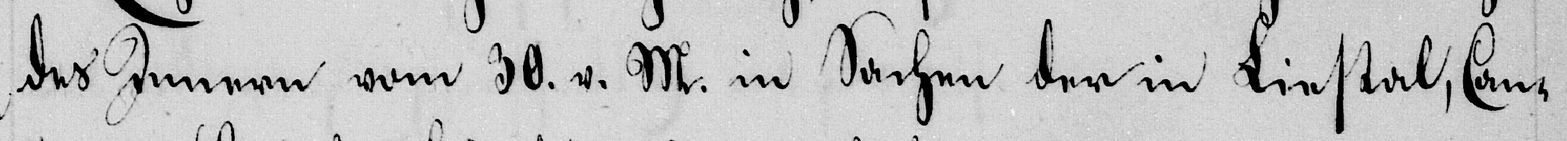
des Innern vom 30. v. M. in Sachen der in Liestal, Can¬
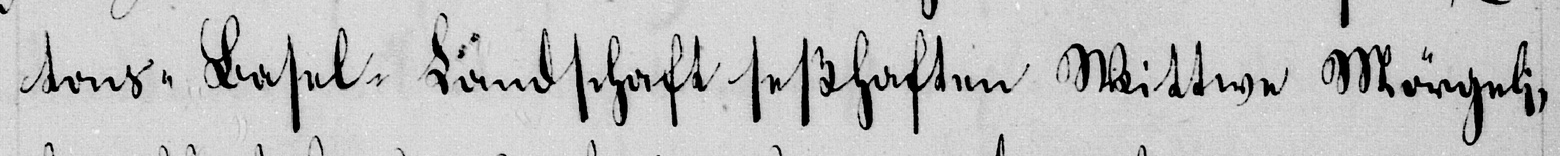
tons-Basel-Landschaft seßhaften Wittwe Mörgeli,
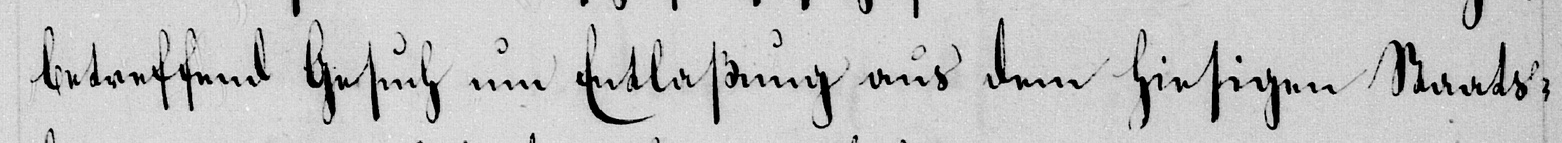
betreffend Gesuch um Entlaßung aus dem hiesigen Staats¬
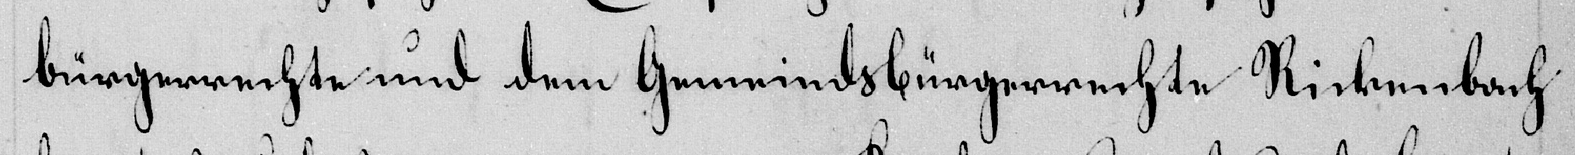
bürgerrechte und dem Gemeindsbürgerrechte Rickenbach
